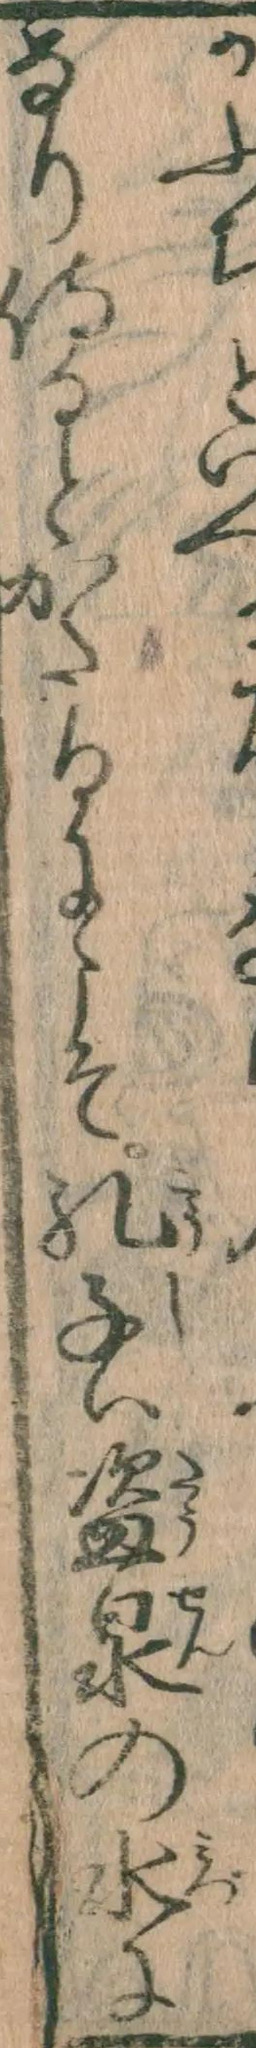なり侍るとかたるにこそ。孔子は盗泉の水に
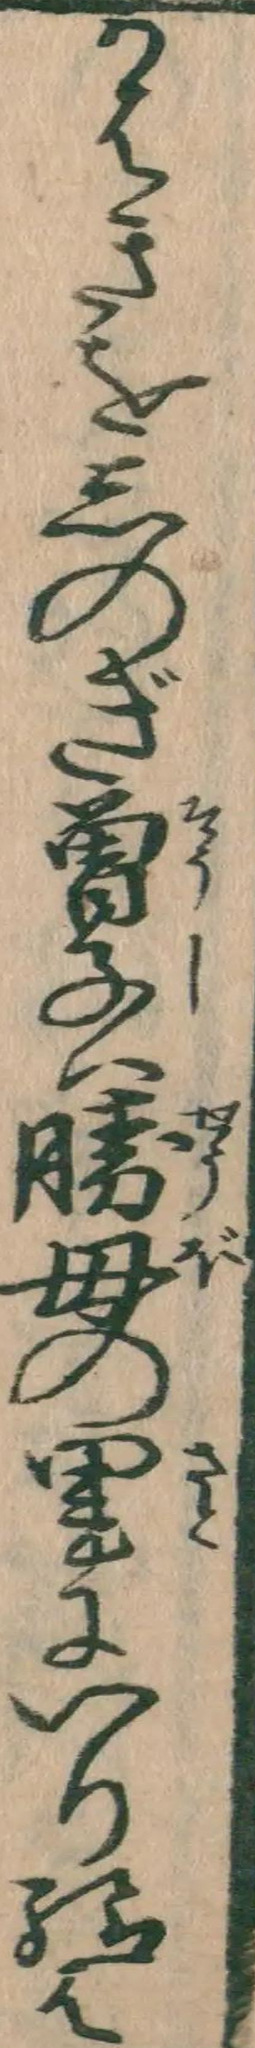かはきをしのぎ曽子は勝母の里にいり給は
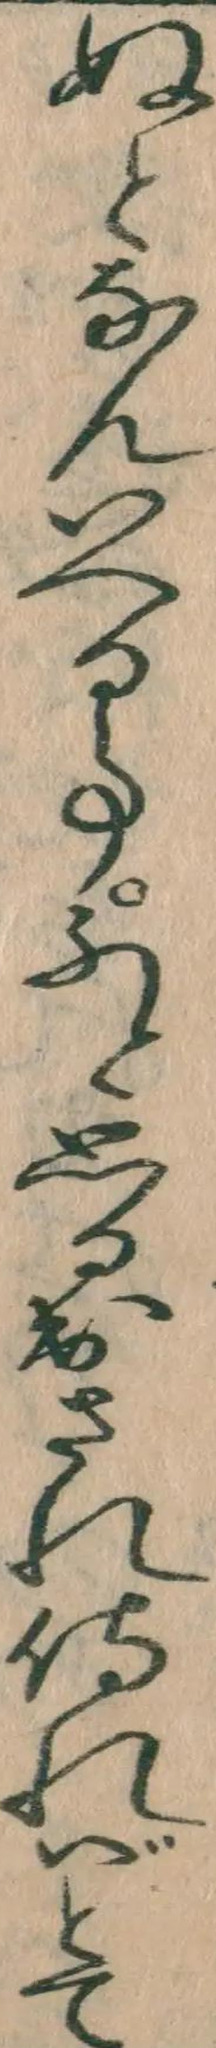ぬとなんいへる事。ふと思ひ出され侍ればとて
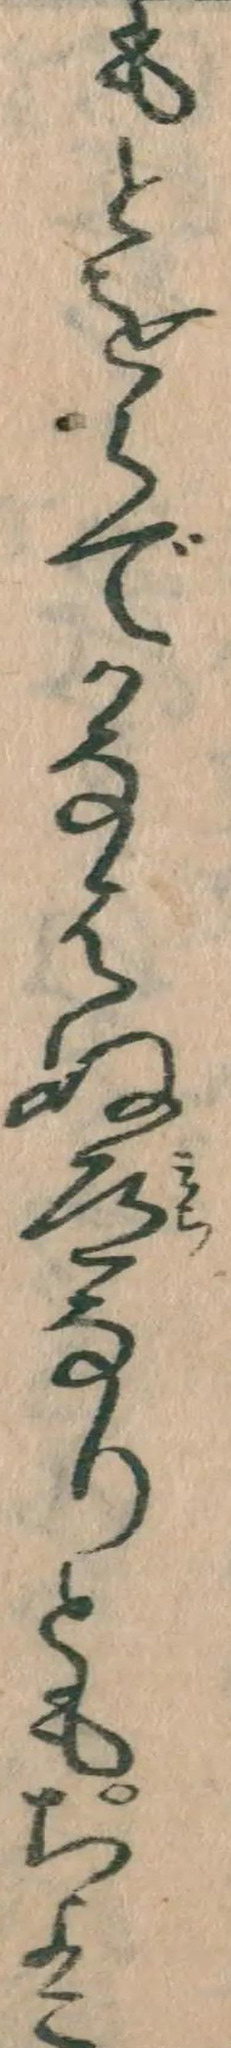もとをらでかなはぬ道なりとも。ちよこ
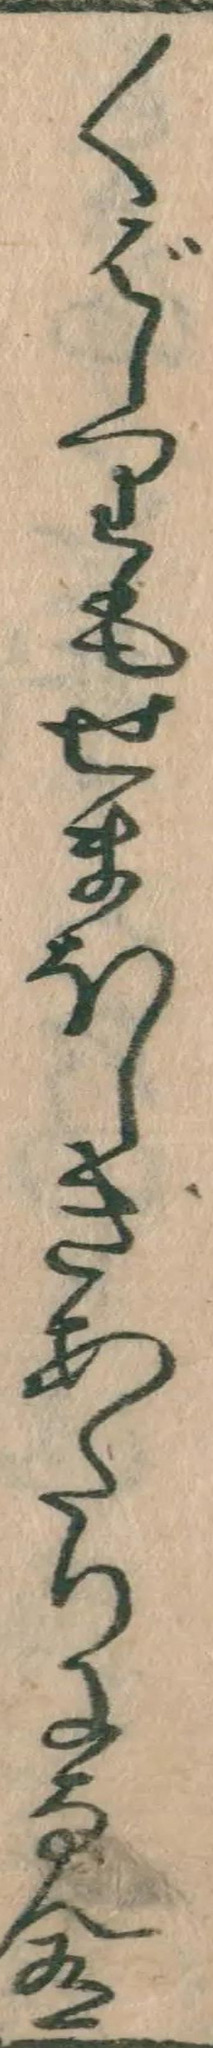〳〵ばしりもせまほしきあたりになん有
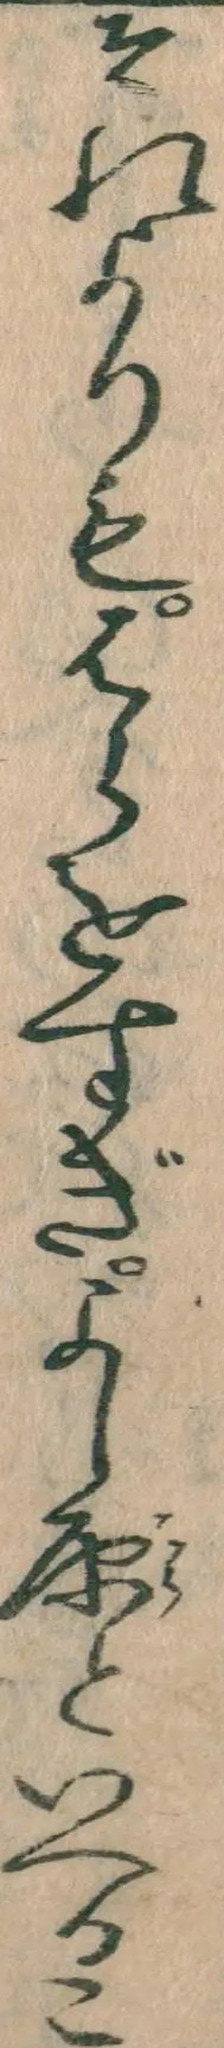それよりも。はらをすぎ。よし原といへるこ
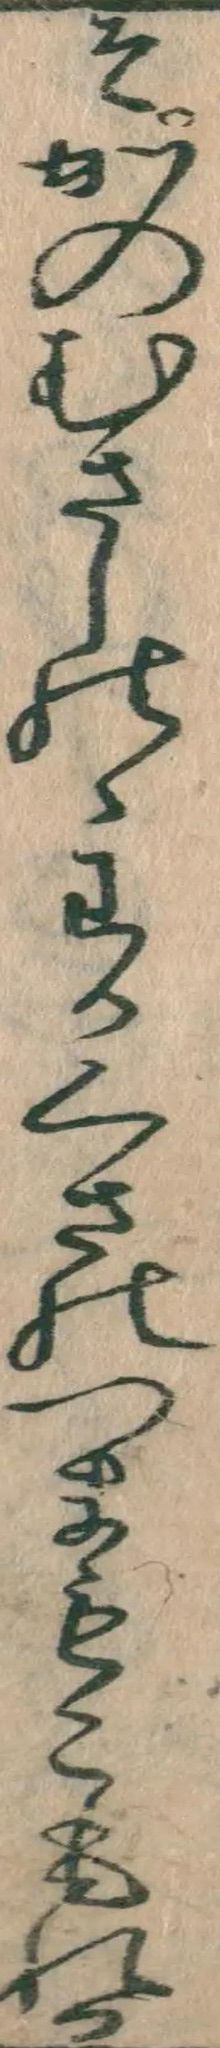そ。かのむさしのゝわかくさのつまもこもれる
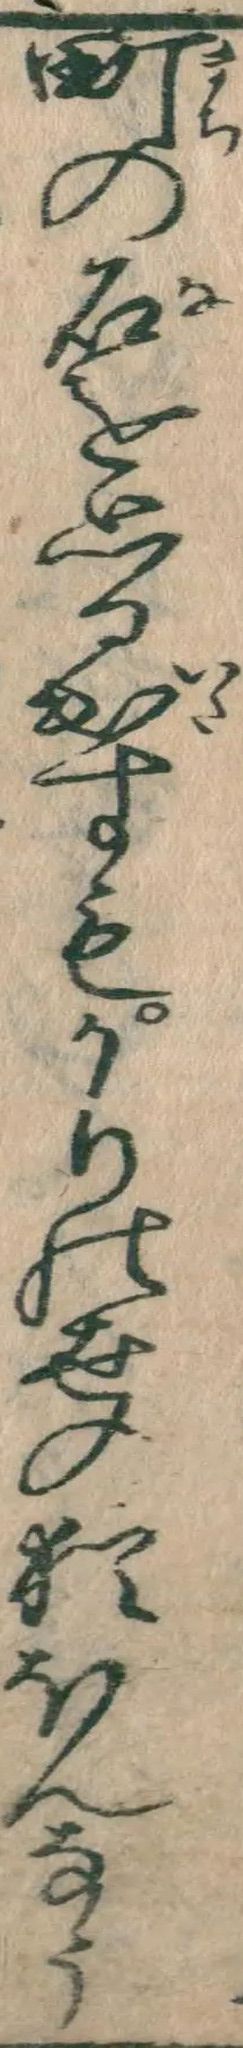町の名を思ひ出すも。かりの世の猶ほんなう
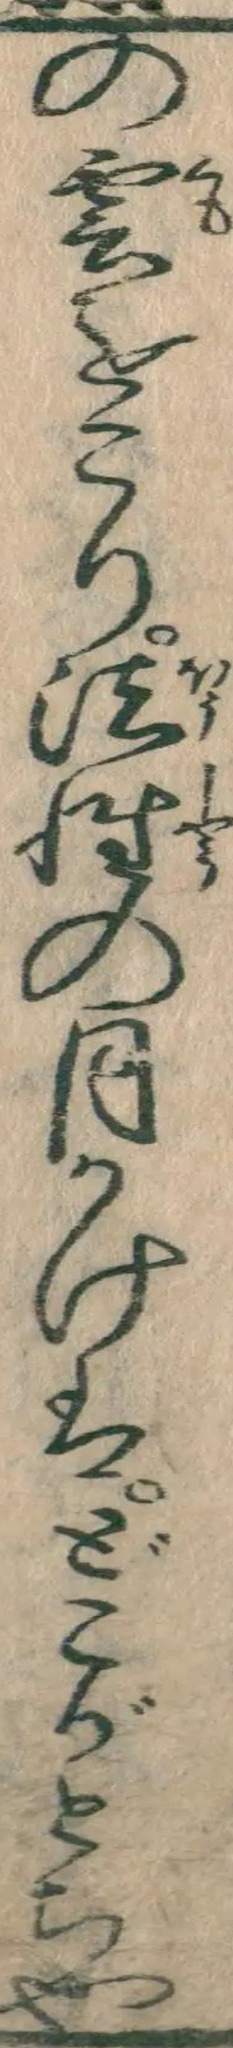の雲をこり。法性の月かけは。どこがとちや
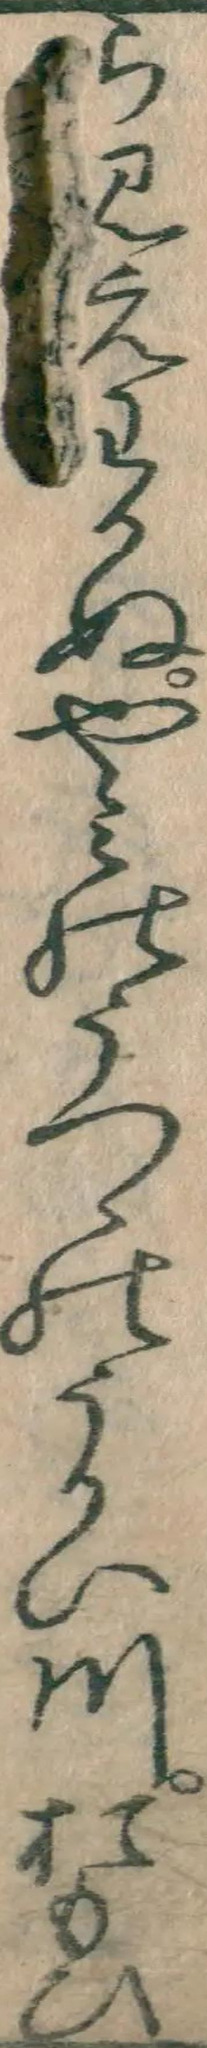ら見えわかぬ。やみのうつゝのうかい川。おもひ
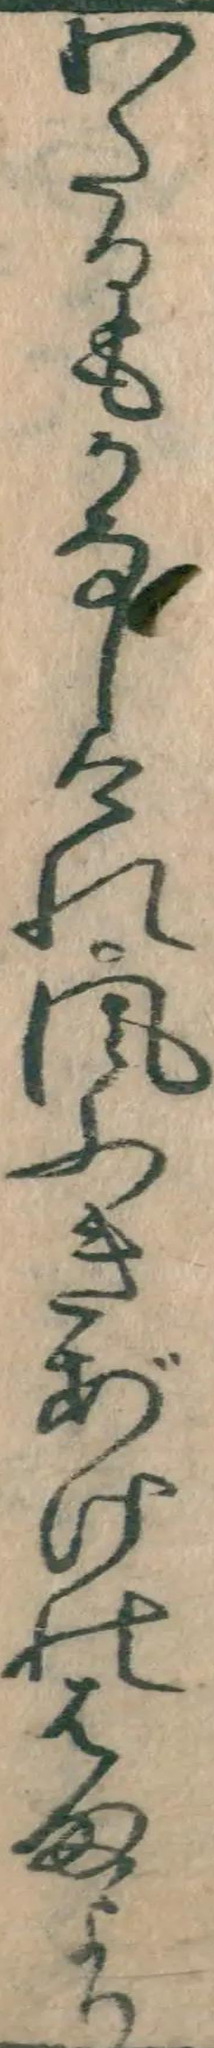わたるもかなしけれ。風ふきあげのはまより

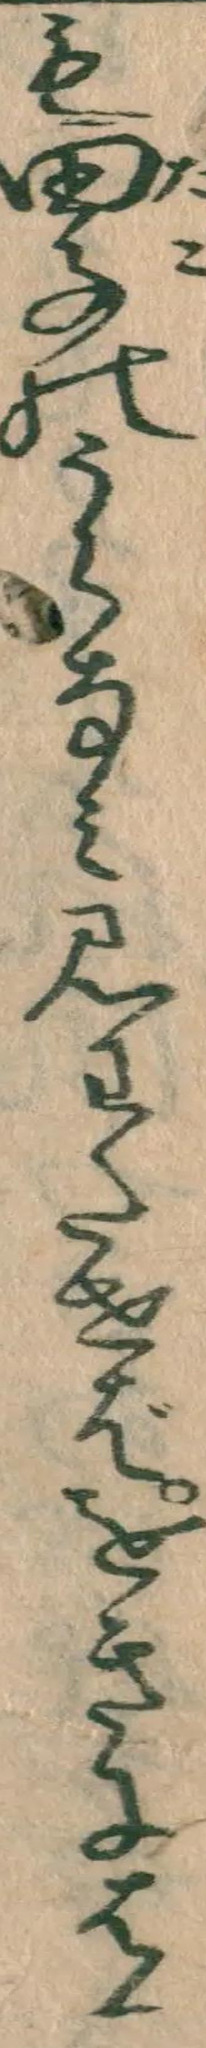も田子のうらなみ見わたせば。をきには
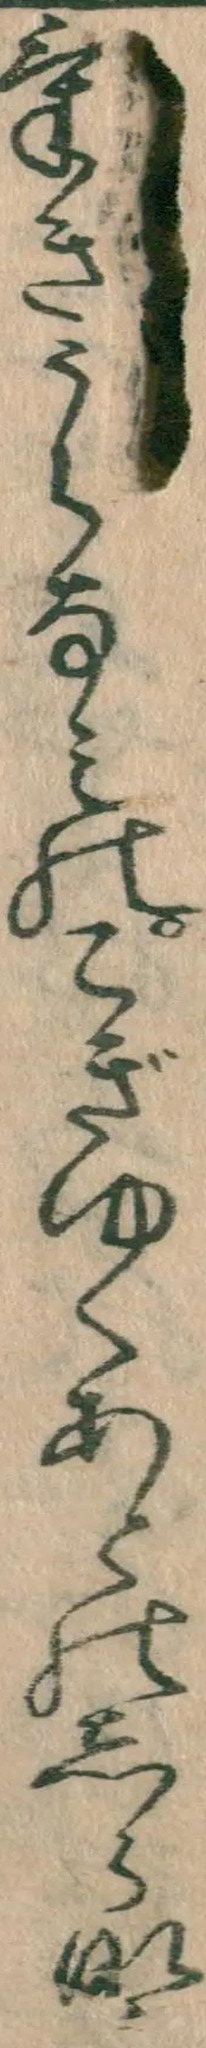けきうらなみの。こぎゆくあとのしらな
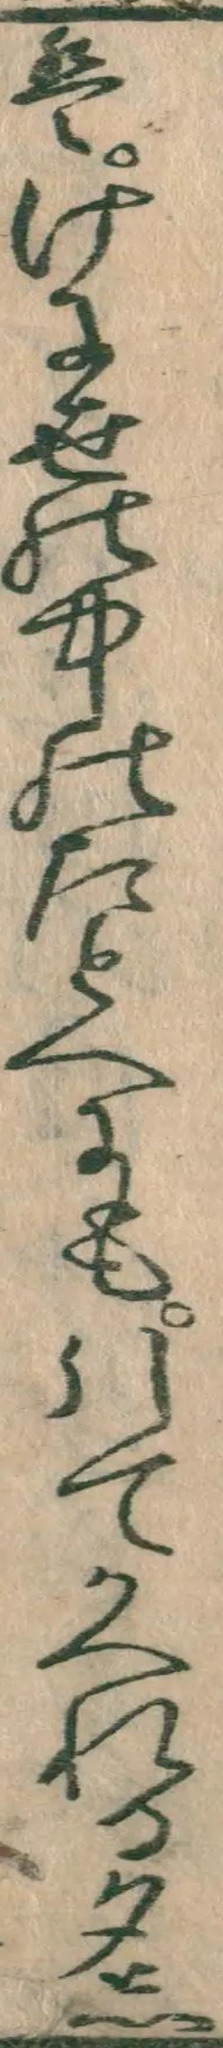は。けに世の中のたとへにも。引てかへれる夕し
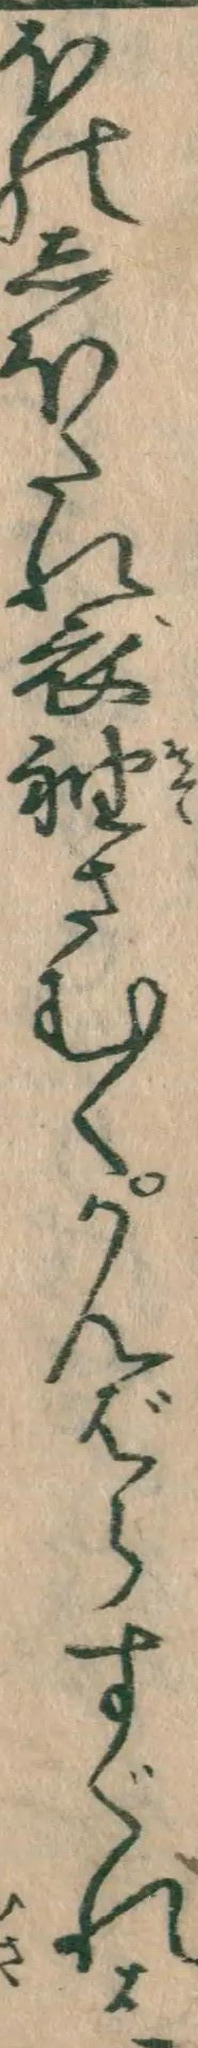ほのしほたれ衣袖さむく。かんばらすぐれは
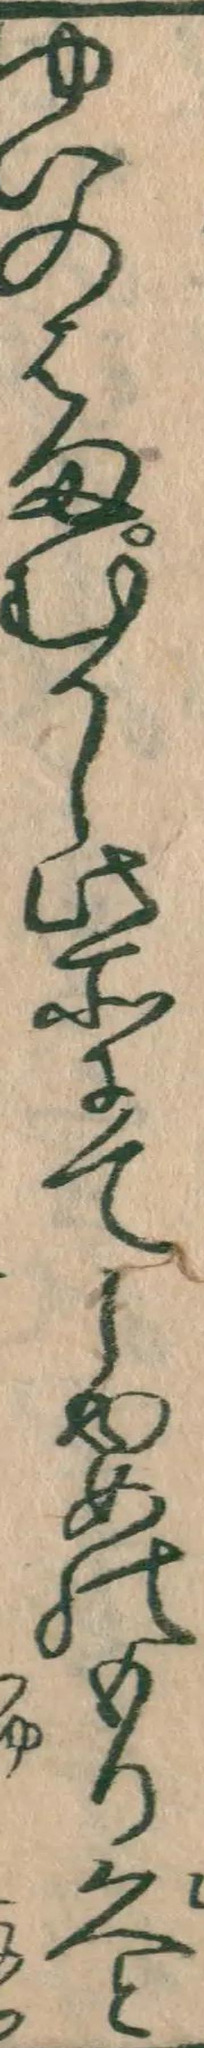ゆいのはま。むかし此所にてしゆめのもり久と
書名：竹斎狂歌物語 3巻
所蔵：国立国会図書館 National Diet Library, JAPAN
